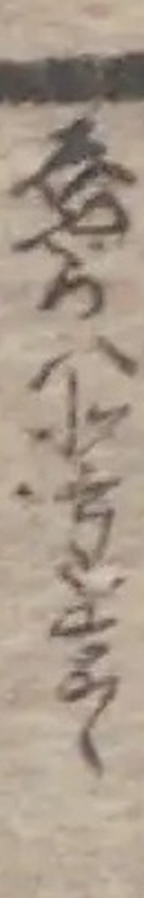しやかは北方をとく
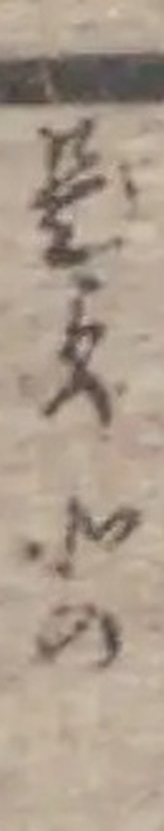是より北の
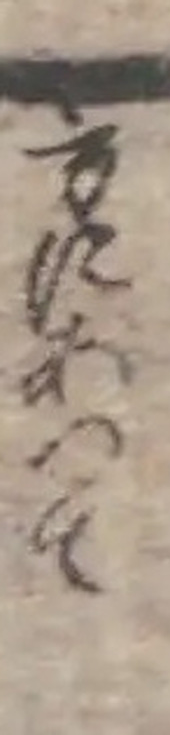方にあつて
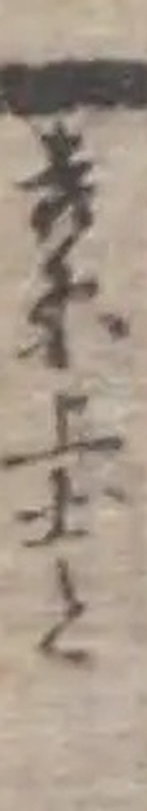吉原上土と
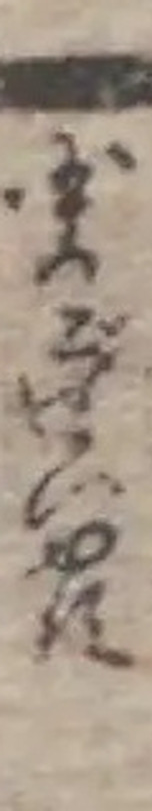国かごせいやす
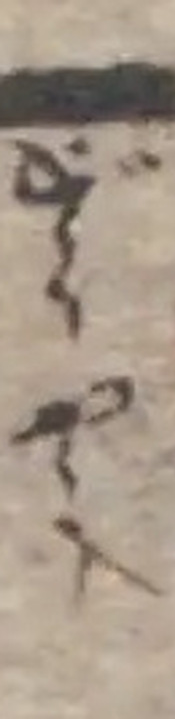どうやら
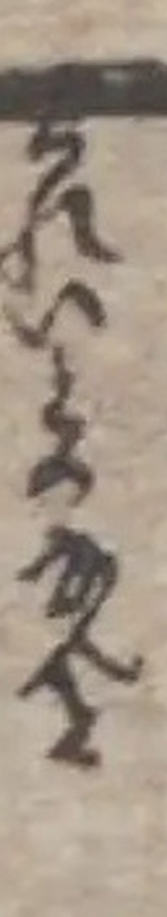かれいとのなんを
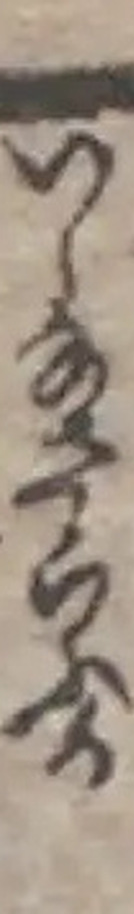いゝなさらふか
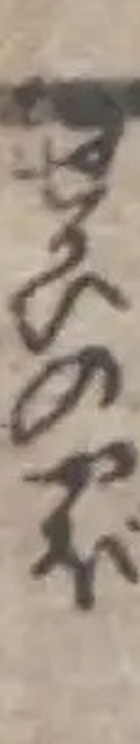せかいのやぼ
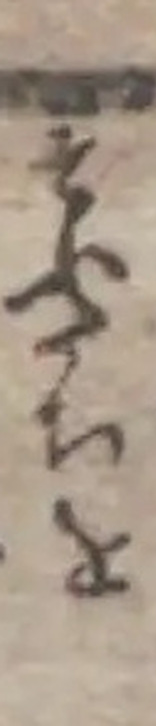そふたちを
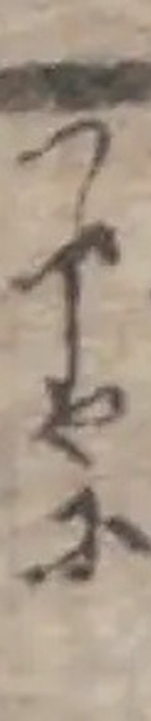つふしやに
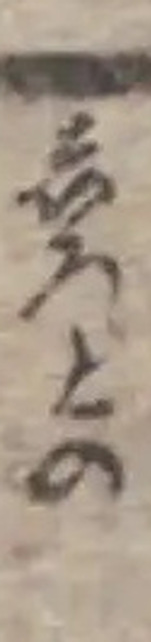しろとの
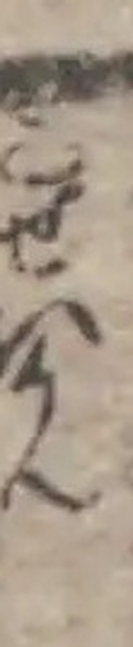こせいかん
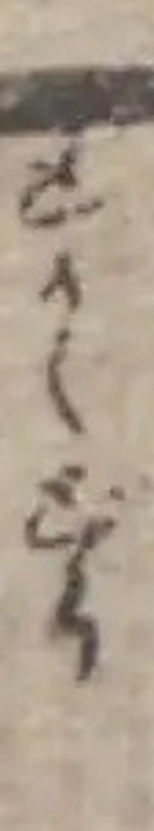とかくどう
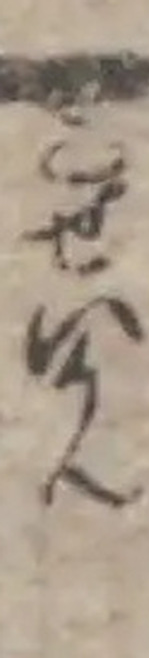こせいかん
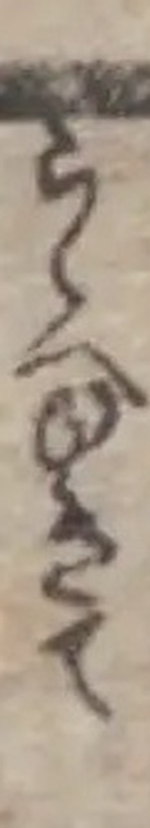らくへゆきて
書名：早出来 3巻
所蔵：国立国会図書館 National Diet Library, JAPAN
